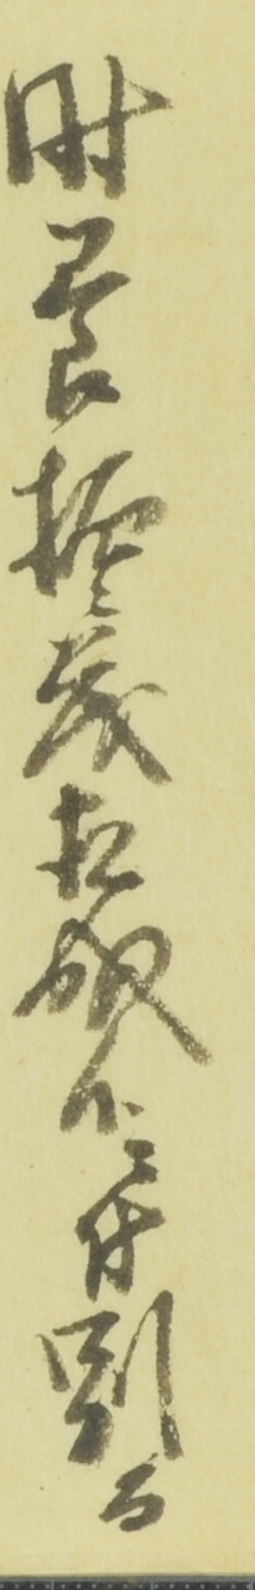時節柄ニも相成候ニ付別而
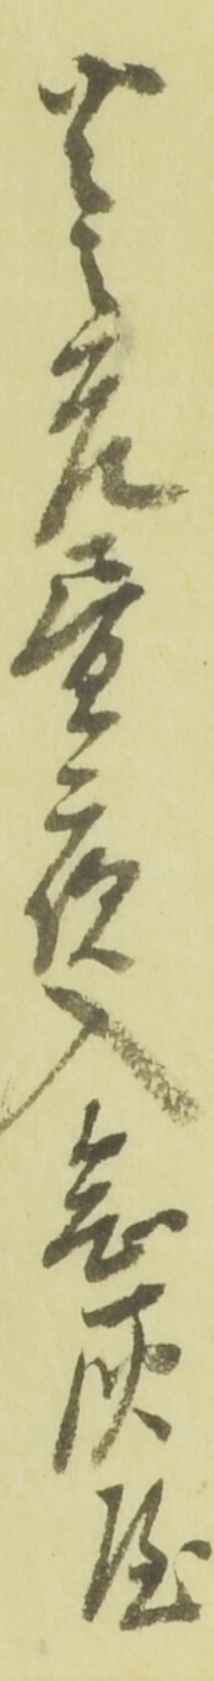火之元昼夜入念灰屋
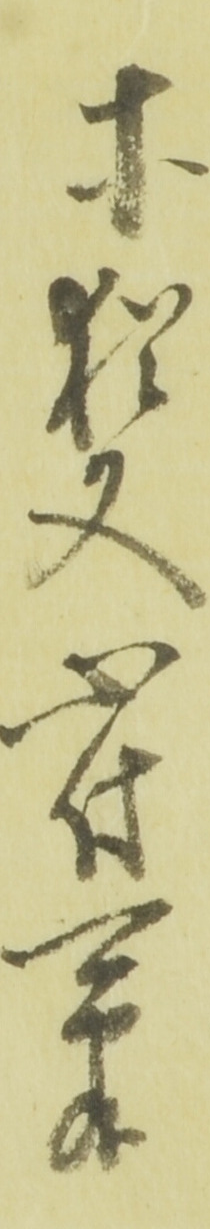等猶又心付可申候
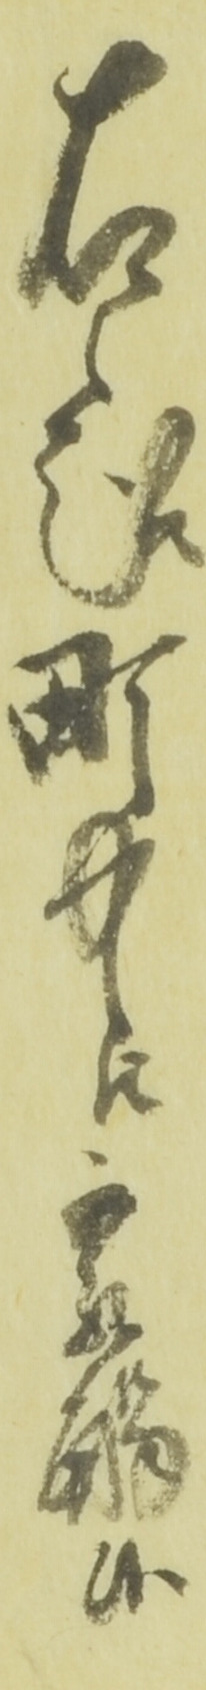右之趣町中江可相触候
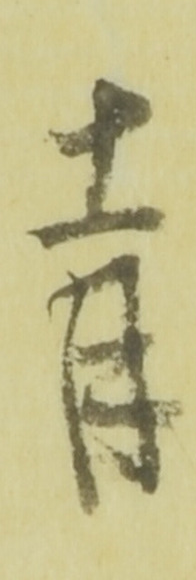十一月
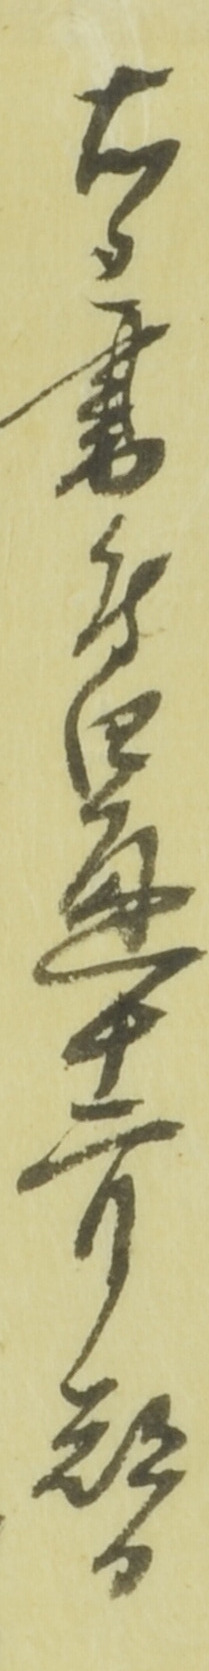右御書付四通十二月都而
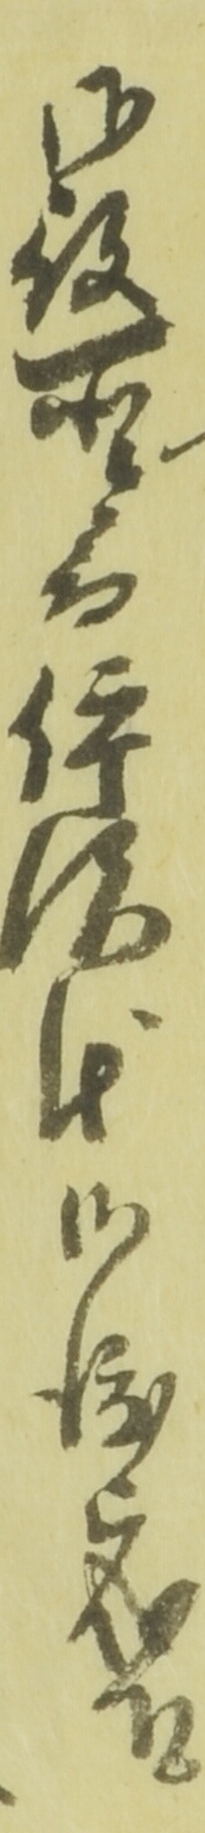御役所ニ而伊沢氏候渡被成下候
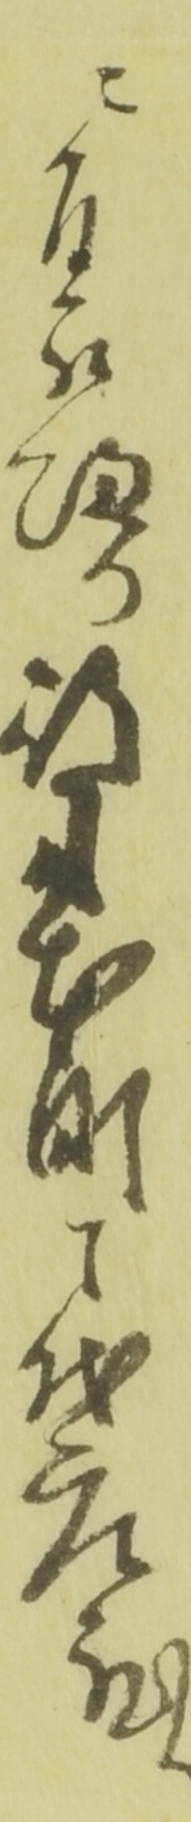ニ付罷帰り行司本町之儀差越候
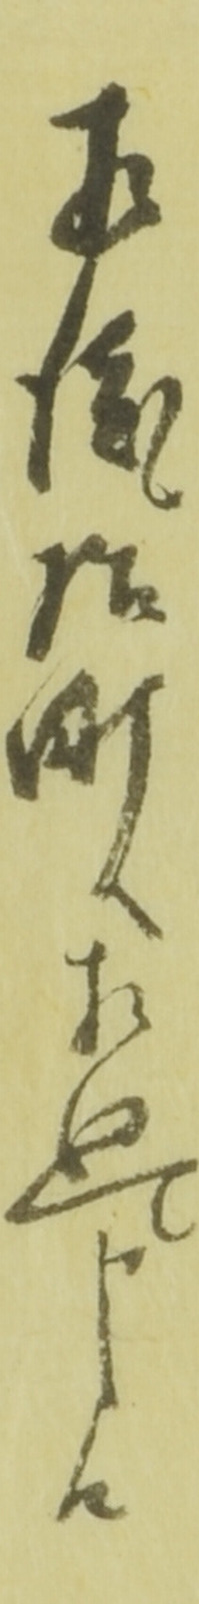相渡候様町へ相廻し申候
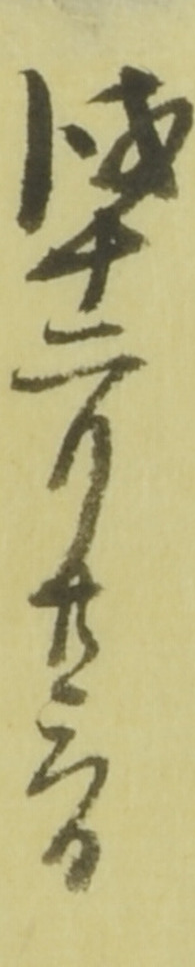戌十二月廿三日
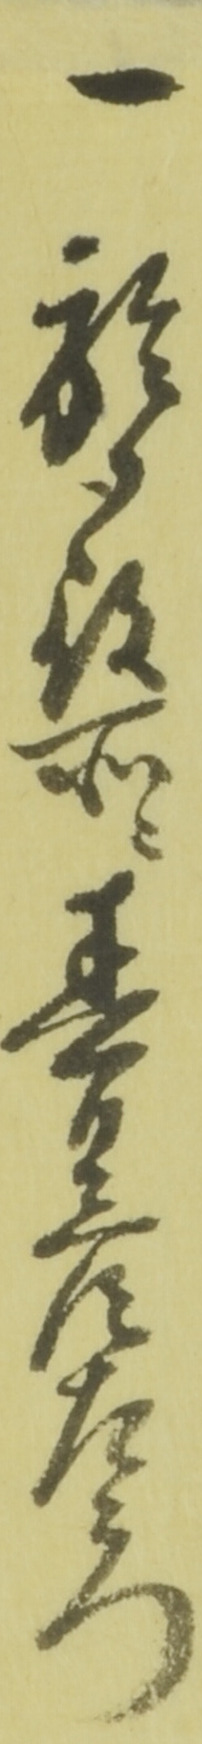一於御役所ニ春日彦左衛門
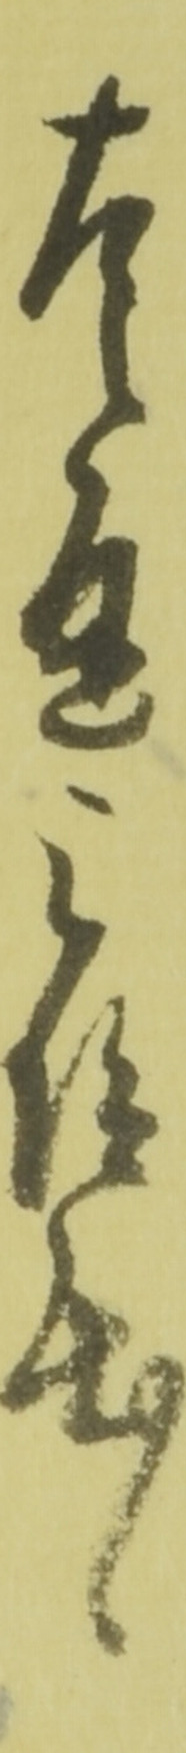左之通被仰出候
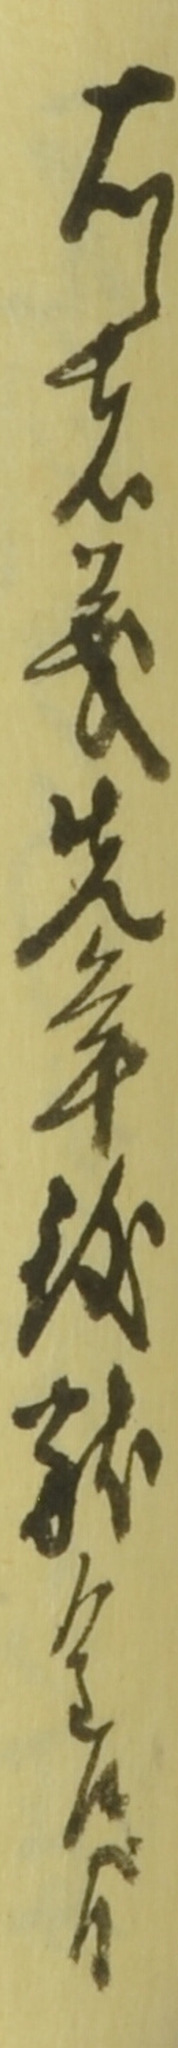右之者義先年致献金候ゟ
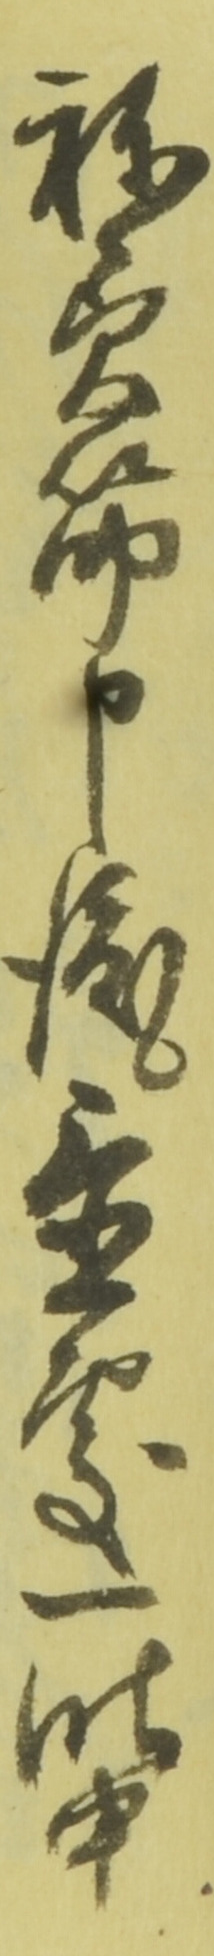称美筋申渡候置処一昨中

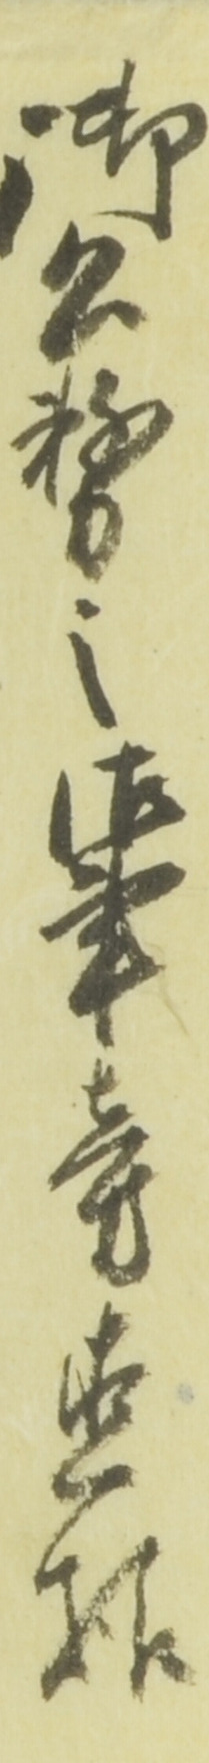御公務之御事旁直様
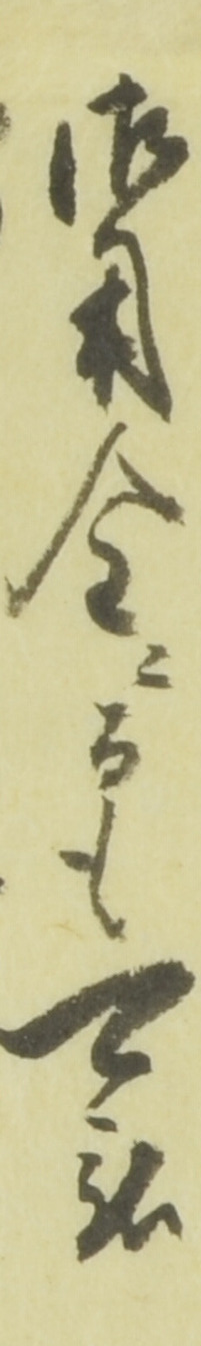御用金ニ而も可被
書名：御触書御書附控
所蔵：伊那市立高遠町図書館・合同会社AMANE
